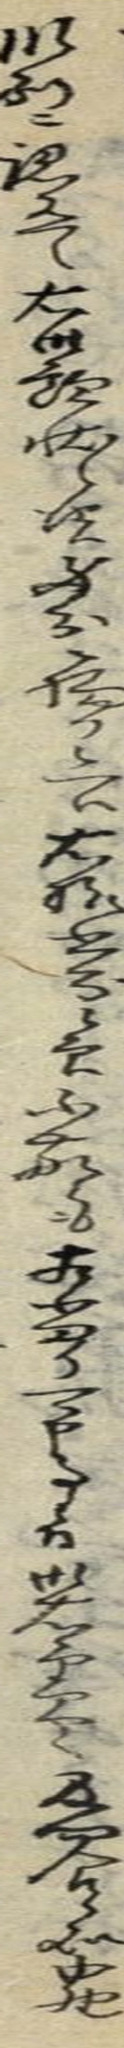御別に認有之右御歓状之儀は身分に拘り候へは右様書分候而は不慶にも相当り可申事に付御右筆部屋へ及問合候処中野
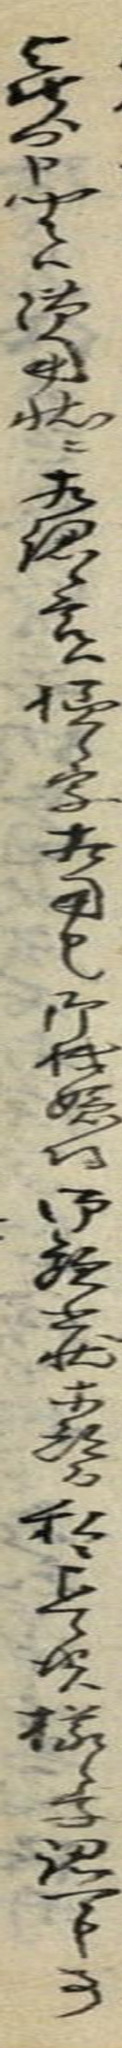与次右衛門申聞候は御用状に相認候節は様之字相用申候御機嫌伺御歓書状等都而私に申上候儀は様之字認可申候事
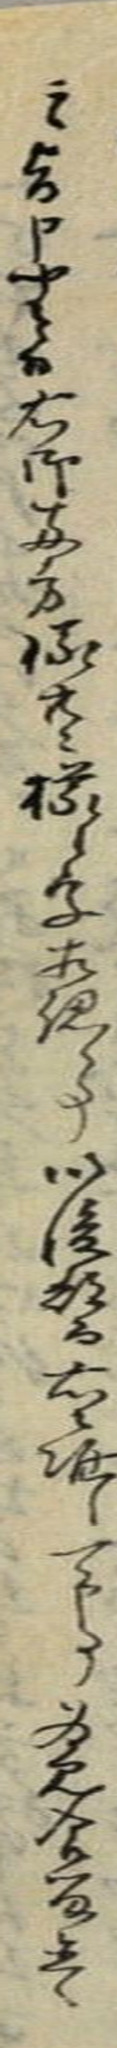之旨申聞候に付右御両方様共に様之字相認候事以後都而右に准し可申事為見合留置候
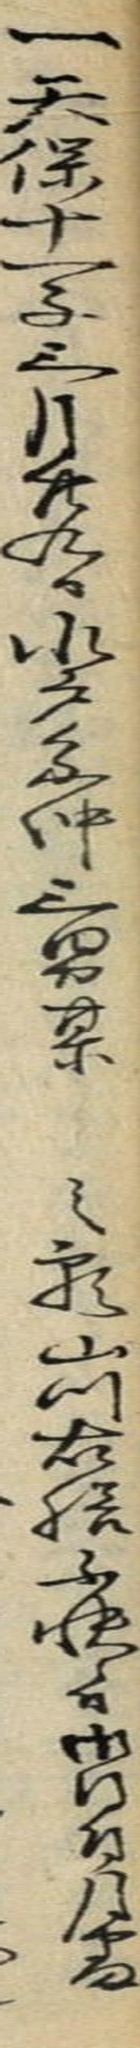一天保十一子三月廿九日水戸多仲三男某之願山川右膳不快に付御目付月番
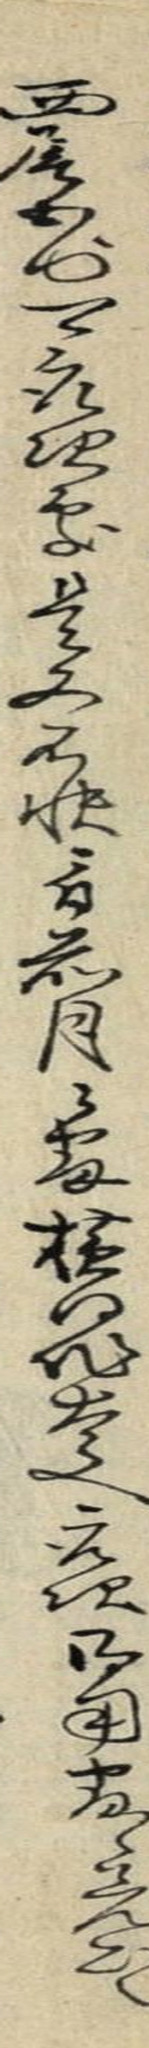西尾五右衛門可取次処是又不快に付前月之番横田作太夫取次御用番へ差出候
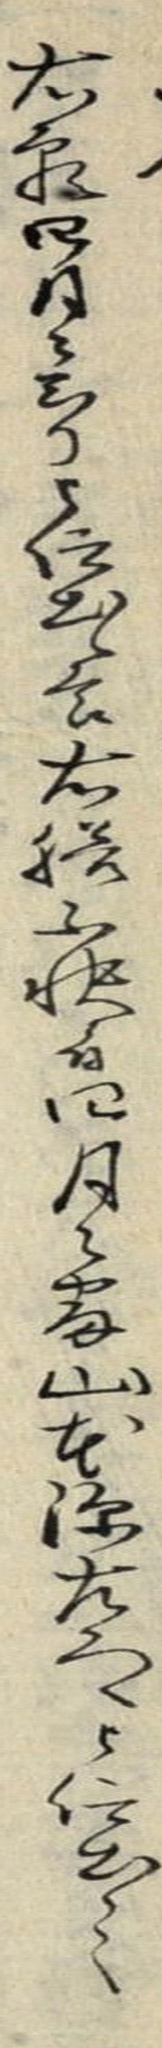右願四月に至り被仰出候節右膳不快に付四月々番山本源左衛門へ被仰出之
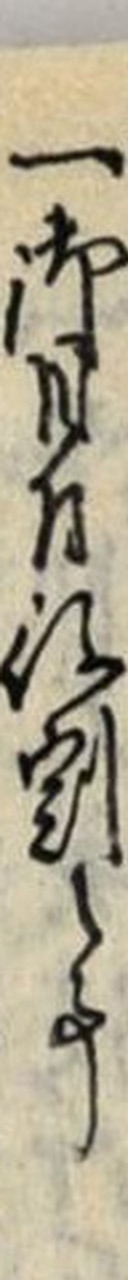一御目付役割之事
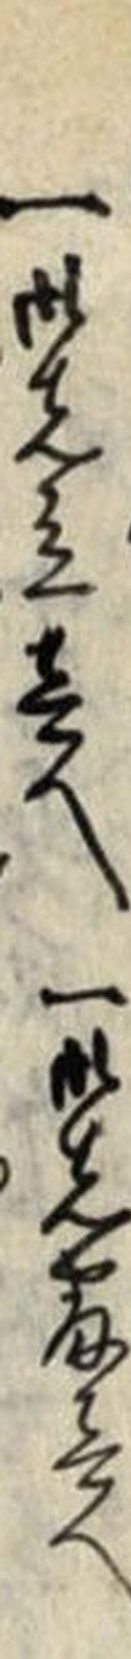一御先立壱人一御礼寄弐人
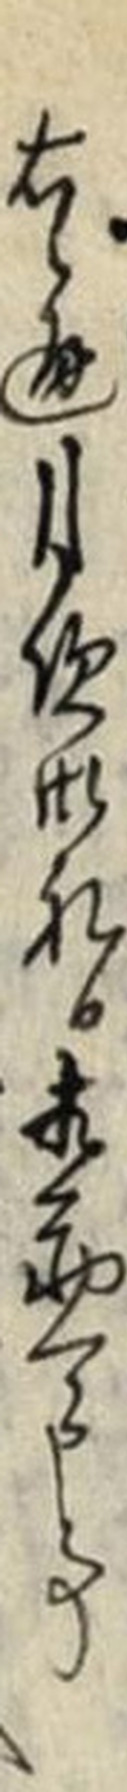右之通月次御礼ゟ相勤候可申事
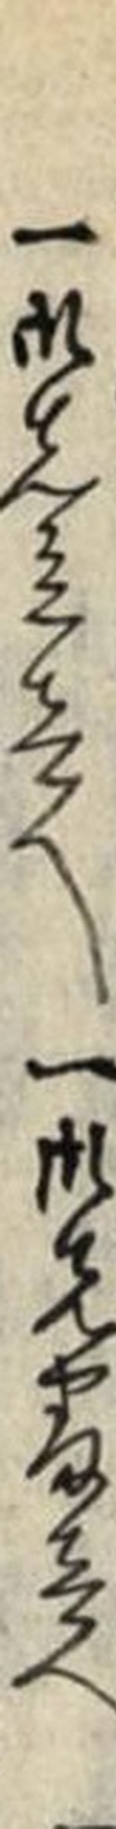一御先立壱人一御礼寄弐人
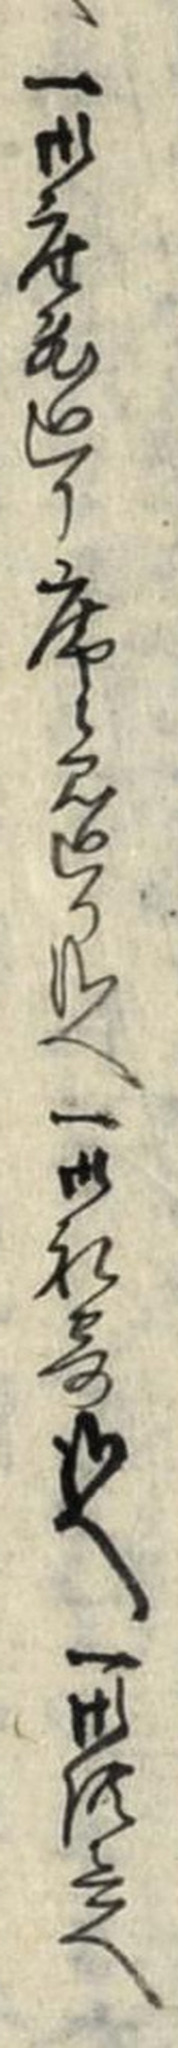一御座敷廻り席々見廻り弐人一御勝手壱人一御供壱人
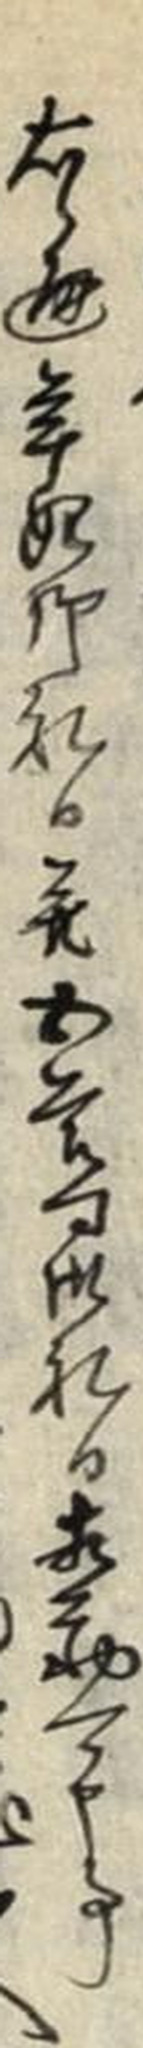右之通年始御礼日并五節句御礼日相勤可申事
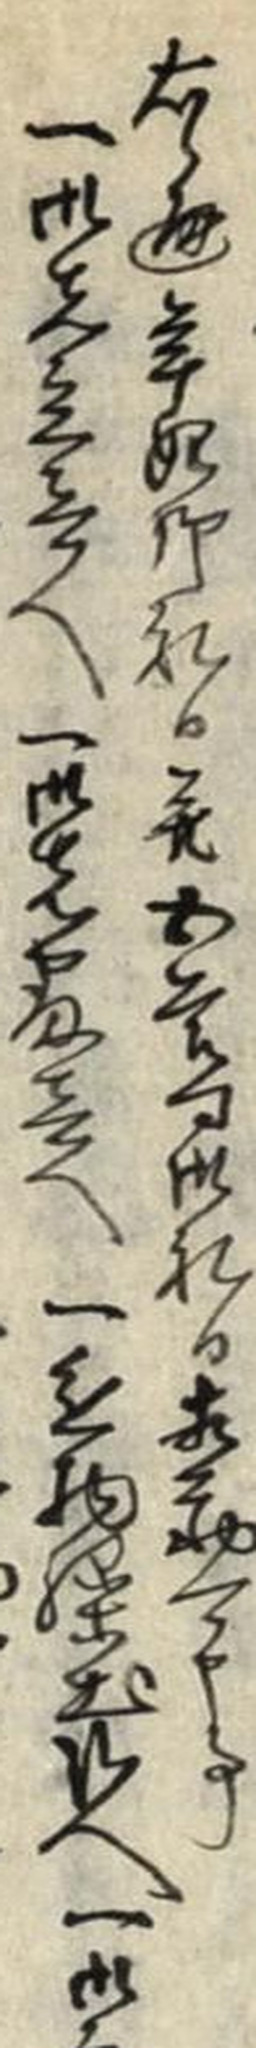一御先立壱人一御先番壱人一進物繰出弐人
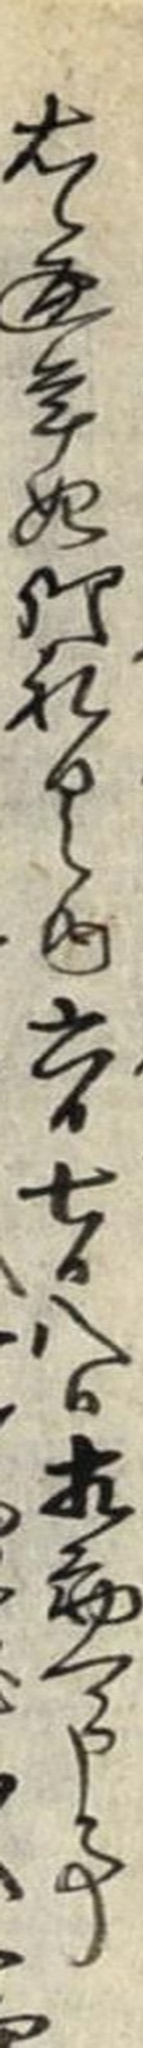右之通年始御礼日之内六日七日八日相勤可申事
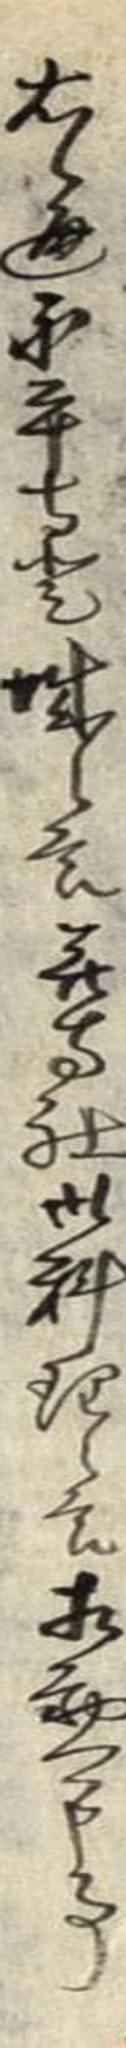右之通永平寺登城之節并寺社御料理之節相勤可申事
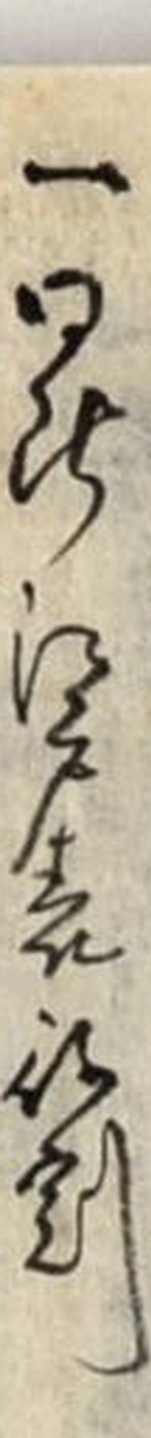一同断江戸表役割
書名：蒐輯之部
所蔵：福井県文書館 Fukui Prefectural Archives
